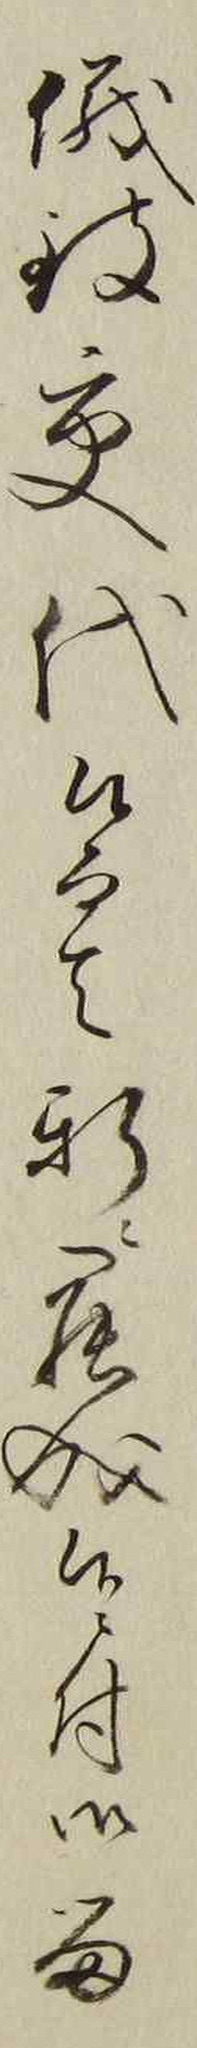儀致交代候而は新ニ罷成候ニ付御留

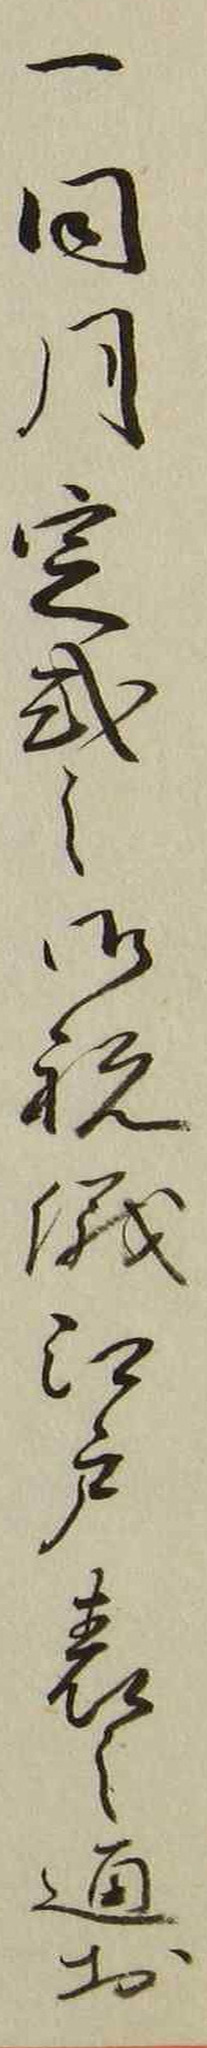一同月定式之御祝儀江戸表之通於
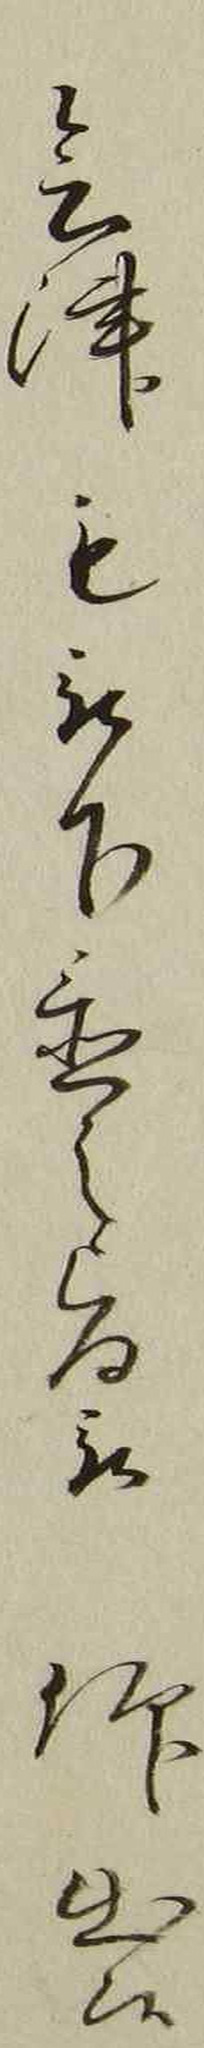会津も被下置之旨被仰出候
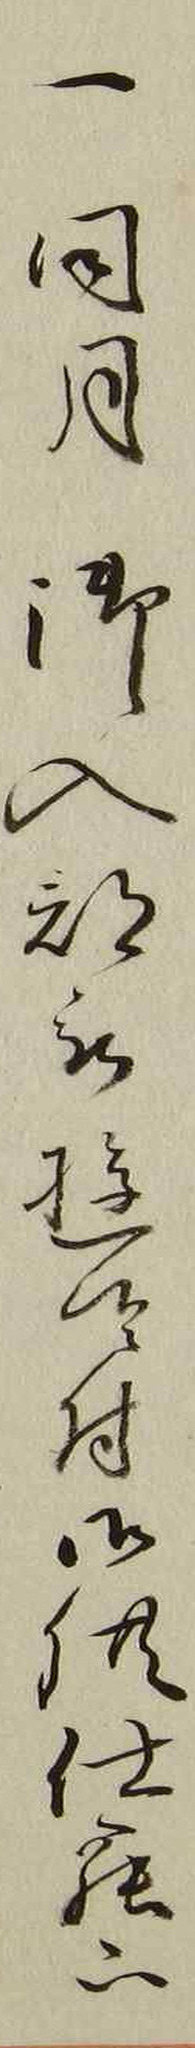一同月御入部被遊候ニ付御供仕罷下
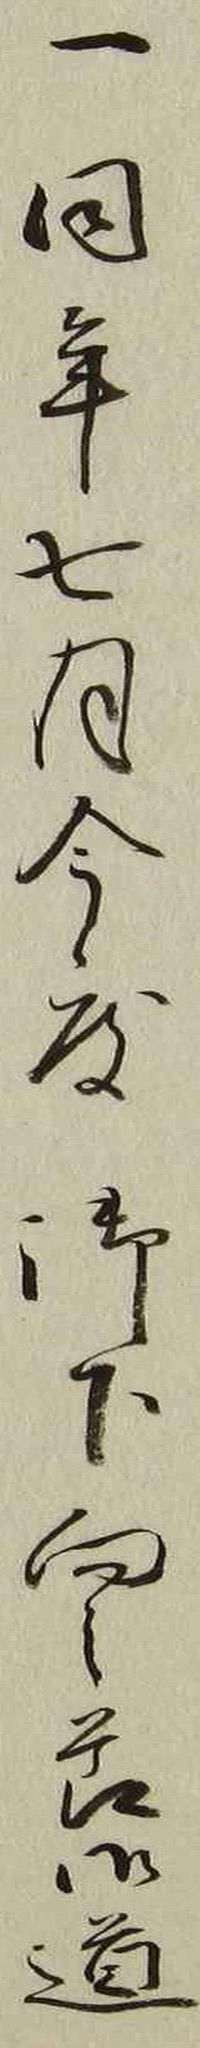一同年七月今度御下向之節御道
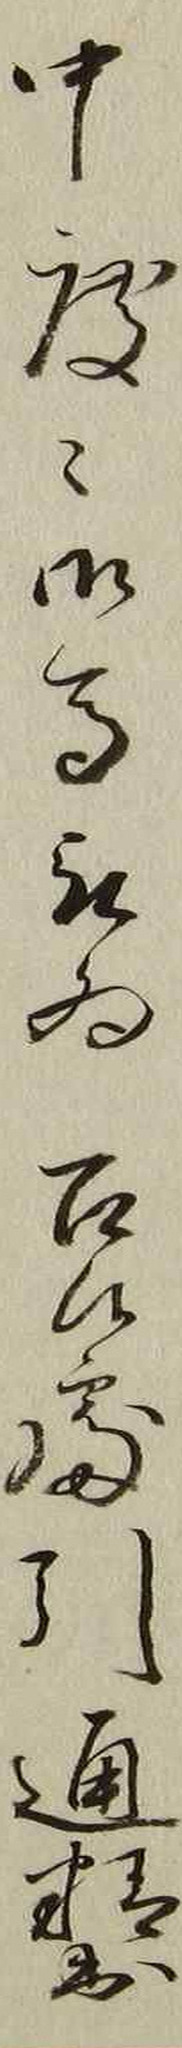中度々御馬被為召候処引通精出
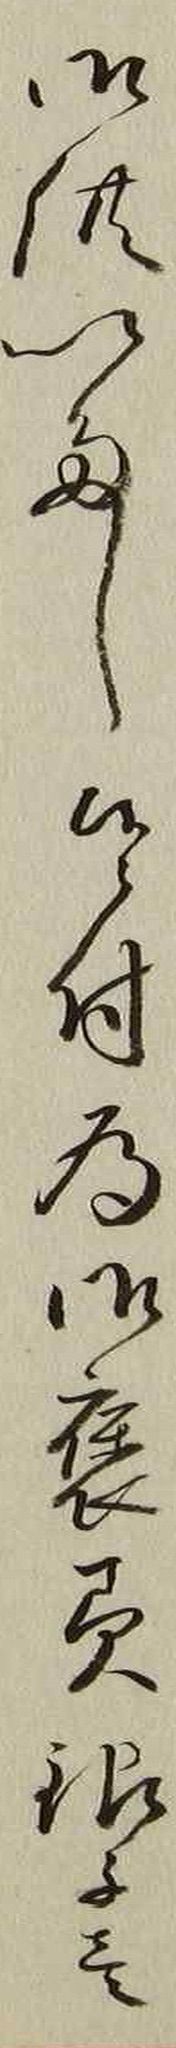御供いたし候ニ付為御褒美銀子壱
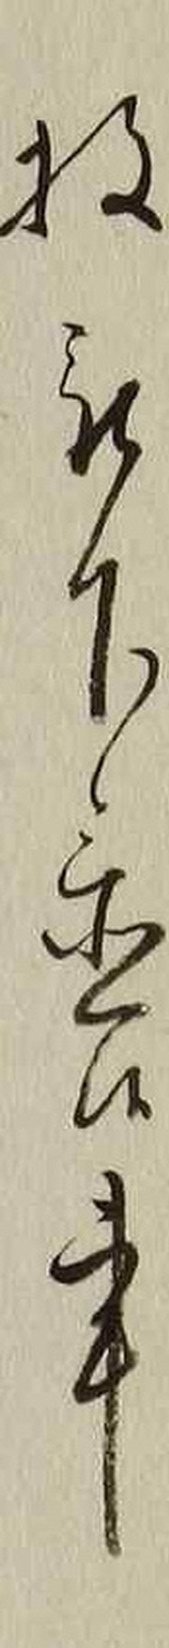枚被下置候事
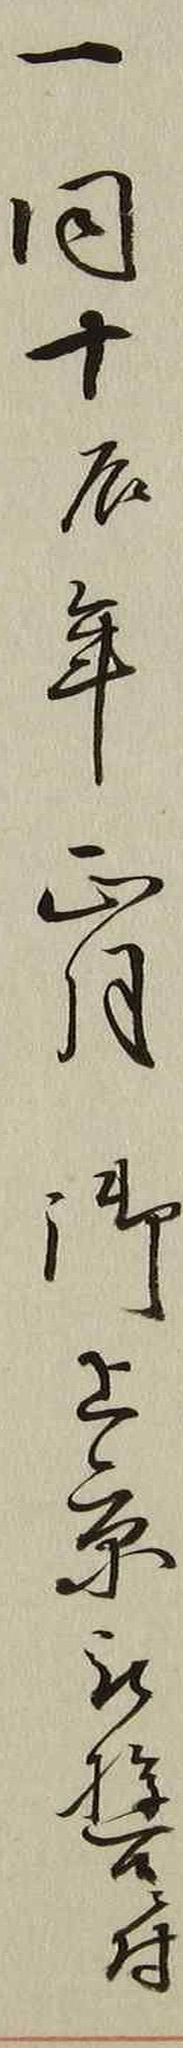一同十辰年正月御上京被遊候ニ付
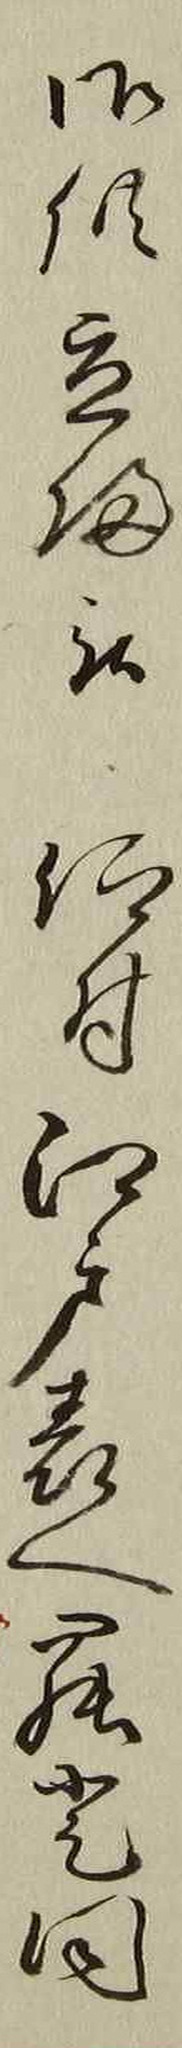御供立帰被仰付江戸表へ罷登同
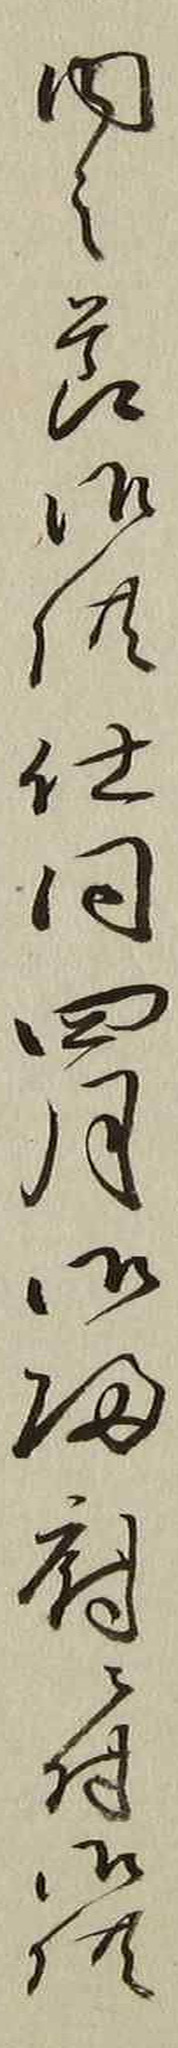内之節御供仕同四月御帰府ニ付御供
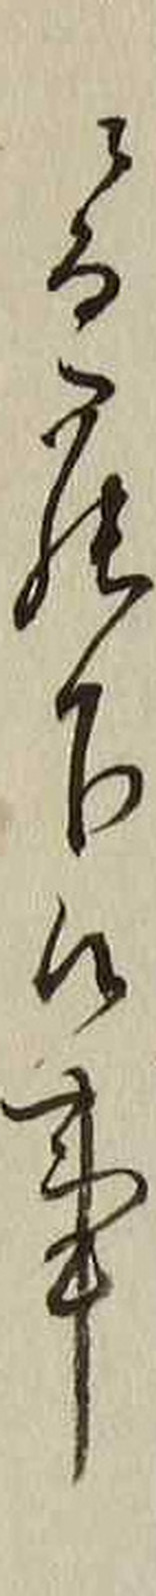ニ而罷下候事
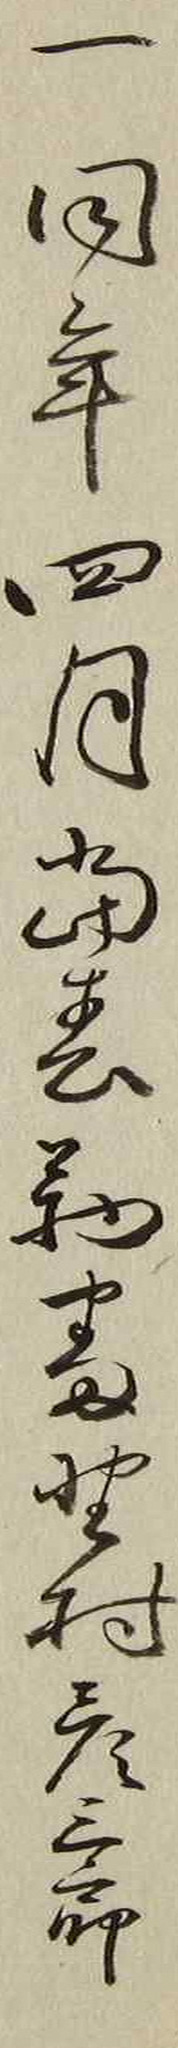一同年四月当春勤番野村彦三郎
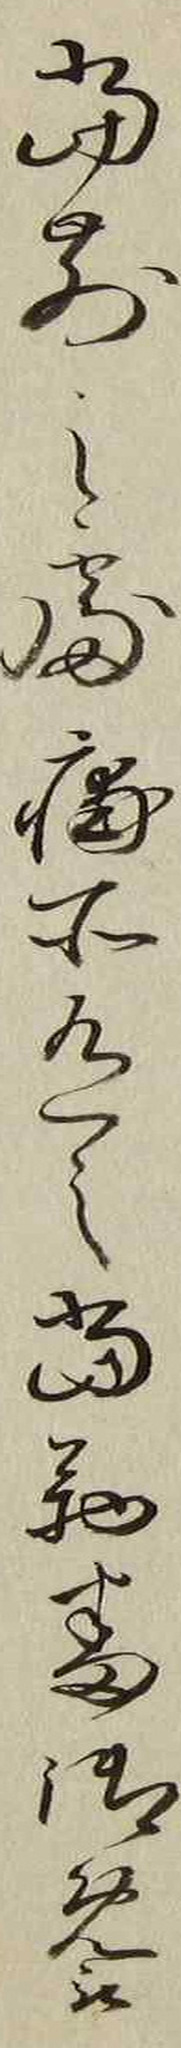当前之処痛所有之当勤番御免被
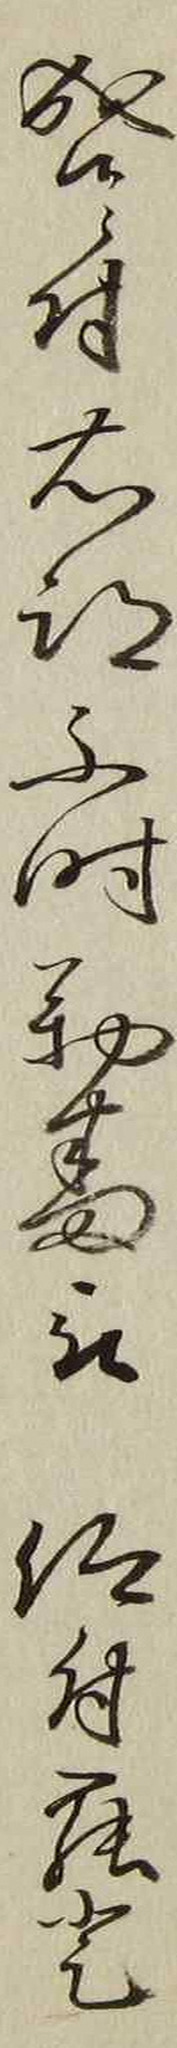成候ニ付右跡不時勤番被仰付罷登
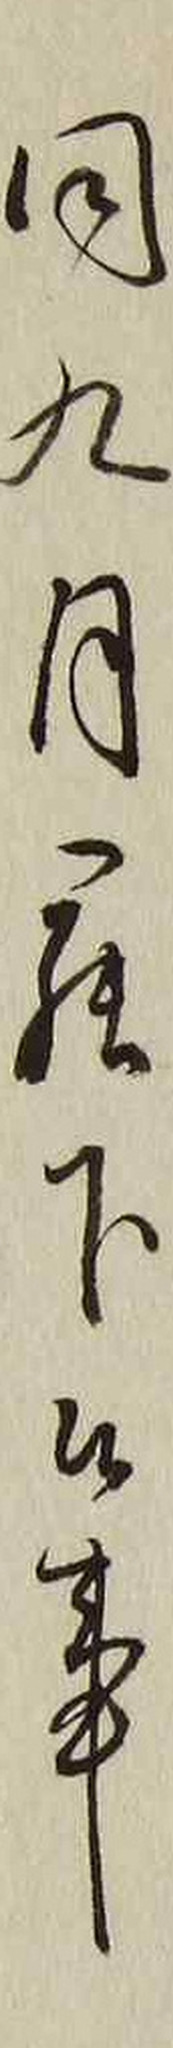同九月罷下候事
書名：諸士系譜　巻之3　い之部3
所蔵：会津若松市立会津図書館
